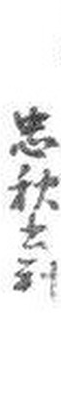忠秋書判
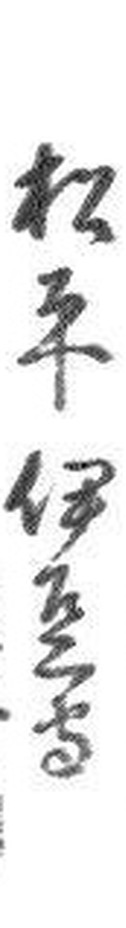松平伊豆守
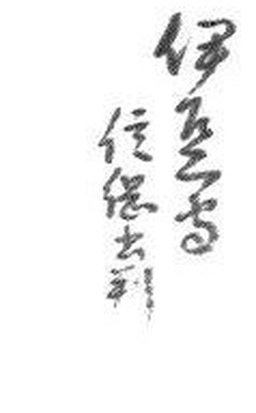信綱書判
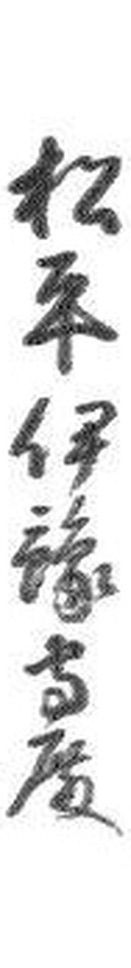松平伊豫守殿
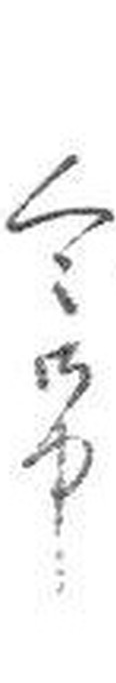人々御中
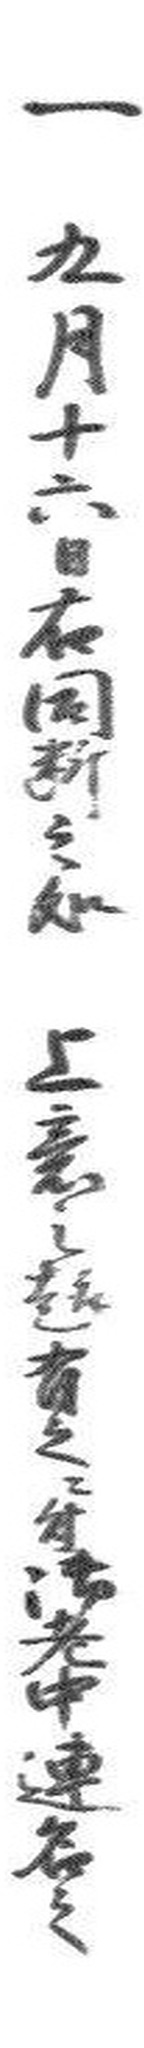一九月十六日右同断之処上意之趣有之ニ付御老中連名之
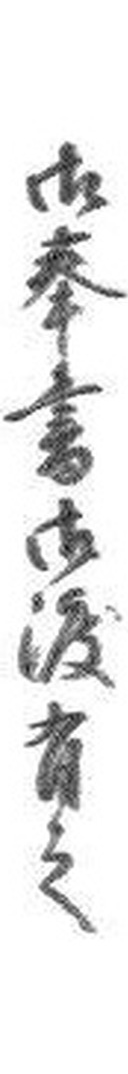御奉書御渡有之

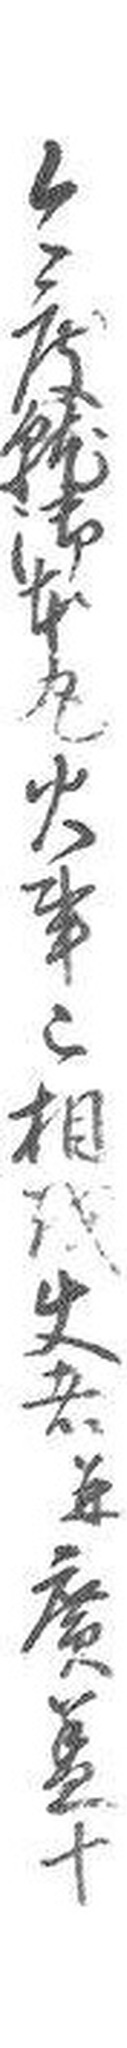今度就御本丸火事被相越使者并広蓋十
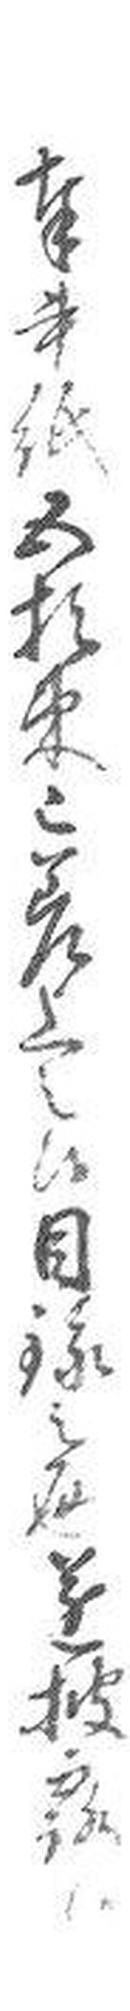奉書紙五拾束被差上之候目録之通遂披露候
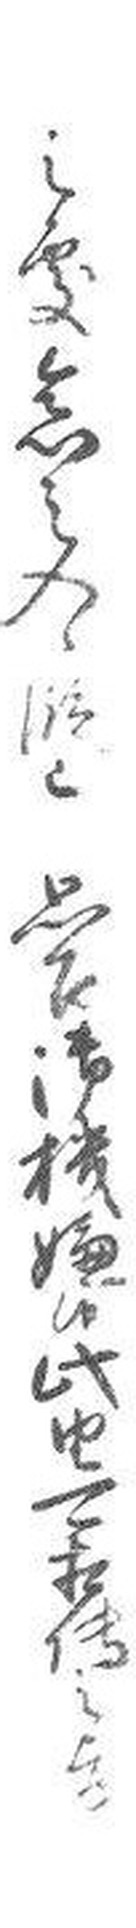之処念之入候段被思召御機嫌候此由可相伝之旨
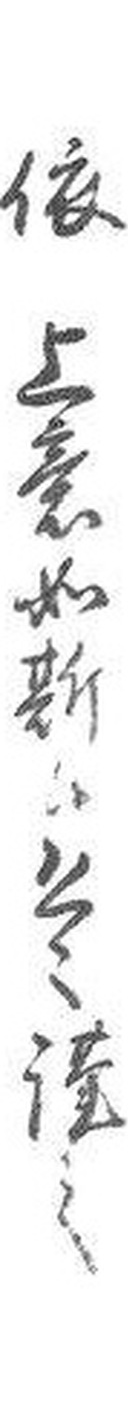依上意如斯候恐々謹言
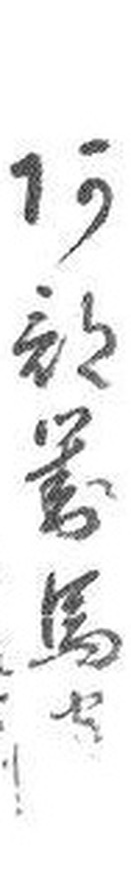阿部対馬守
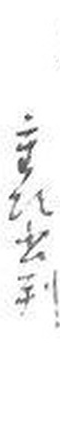重次書判
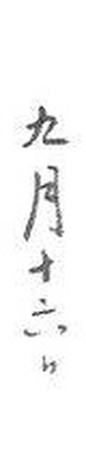九月十六日
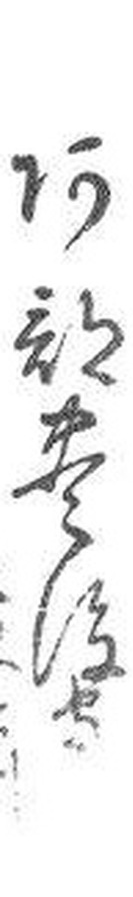阿部豊後守
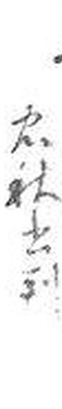忠秋書判
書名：家譜 四 忠昌公 従寛永七年到正保四年
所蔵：福井県文書館 Fukui Prefectural Archives
